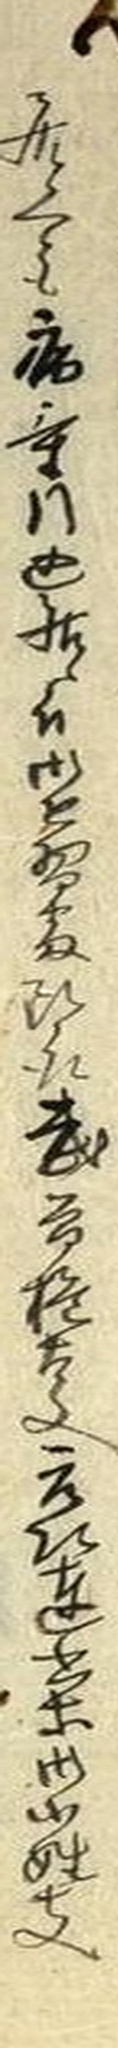居候へとも病気引込居候ニ付御近習番頭取武曽権太夫取次達書等御小姓支
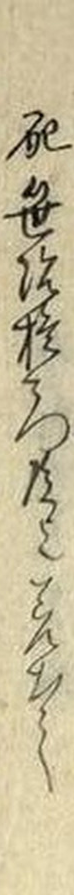配笹治権右衛門殿迄差出之
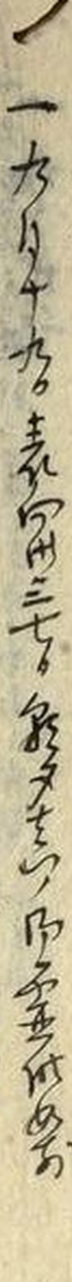一九月十九日表向御三七日朝夕真ノ御霊供如前
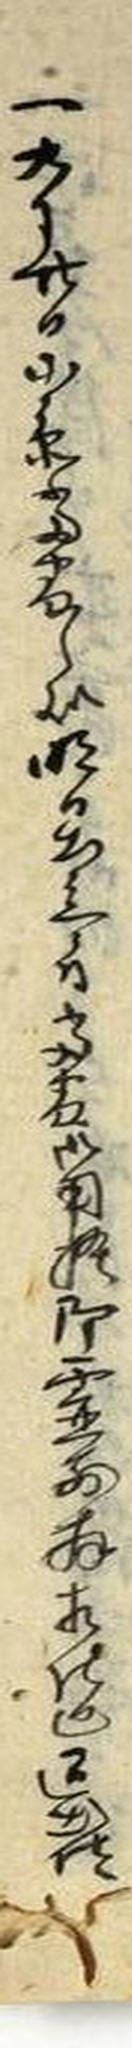一九月廿日小兵衛当番之処明日出立ニ付当番御用捨御霊前拝相仕廻迄出仕候

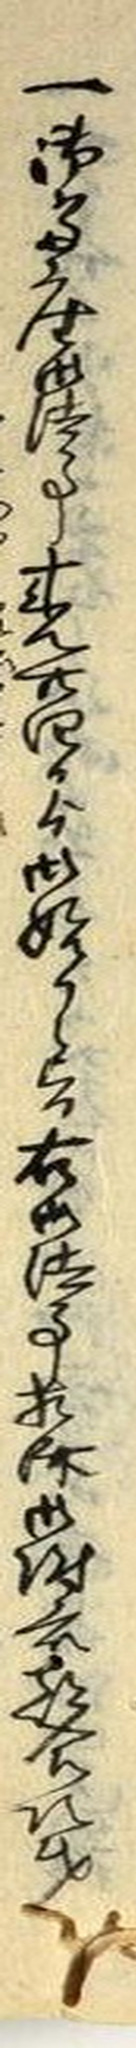一御当座御法事来ル廿四日ゟ御始り候旨右御法事相済御附衆都合次第
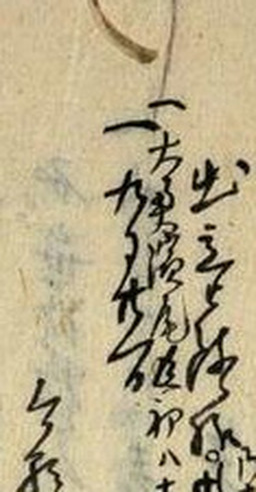一九月廿一日
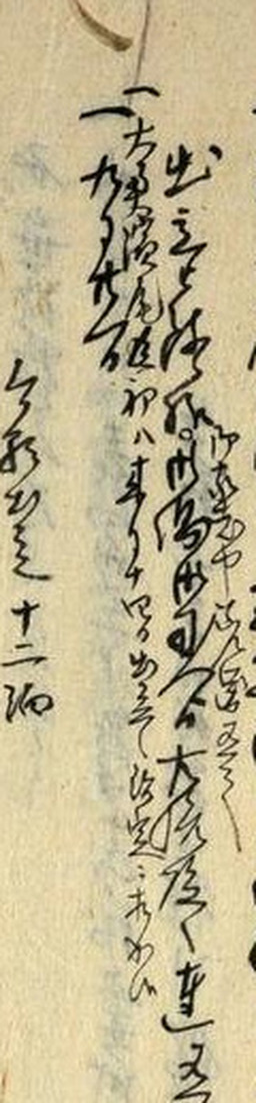一大奥浜尾殿初ハ来月十四日出立之治定ニ相成候

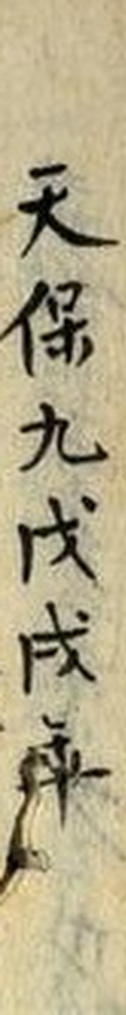天保九戊戌年
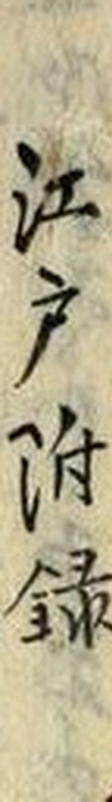江戸附録
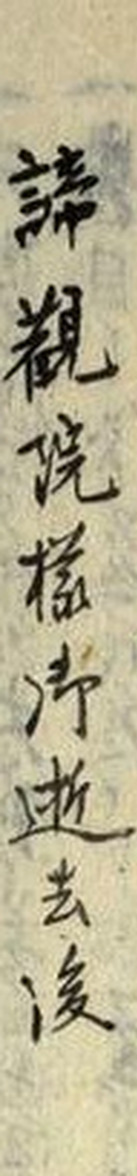諦観院様御逝去後
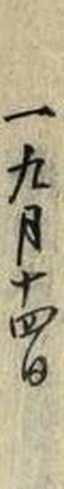一九月十四日
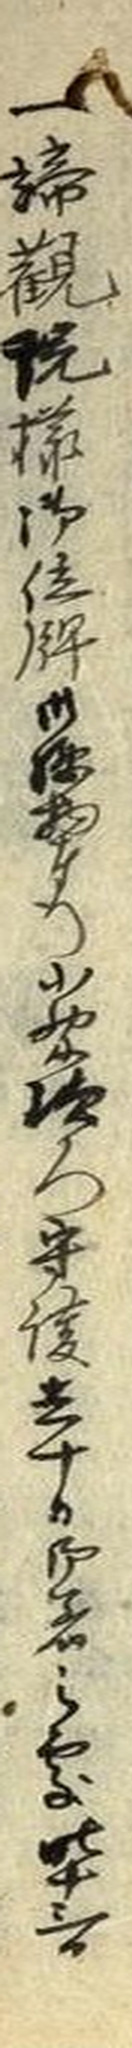一諦観院様御位牌御腰物奉行小栗次右衛門守護去十日御着之処昨十三日
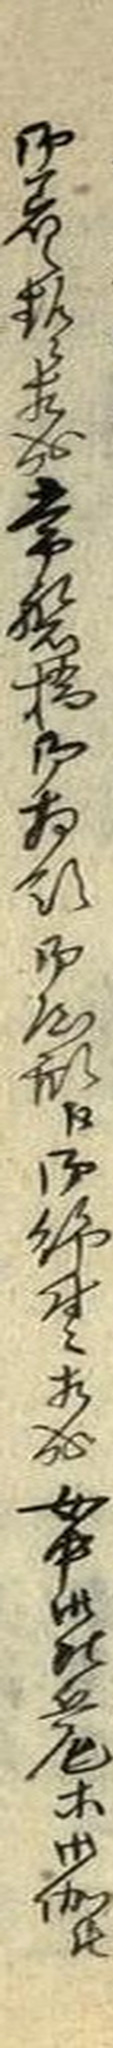御着趣ニ相成常磐橋御拝領御屋形江御飾付ニ相成女中御比丘尼等御伽被
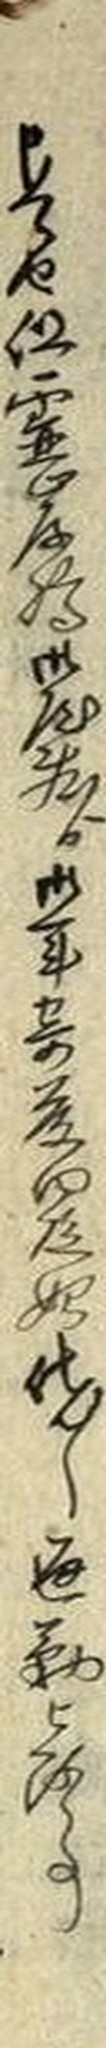申上候由但霊岸嶋御屋敷ゟ御年寄藤田殿始代ル〳〵通勤被致候事
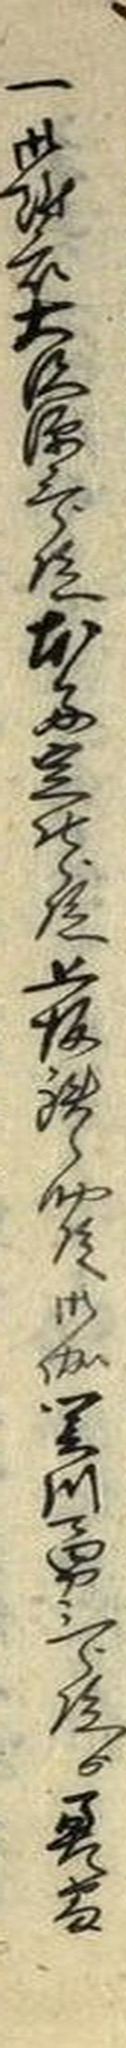一御附衆大沢源三郎殿本多定次郎殿上坂鉄之助殿御伽関川勇三郎殿ゟ奥之番
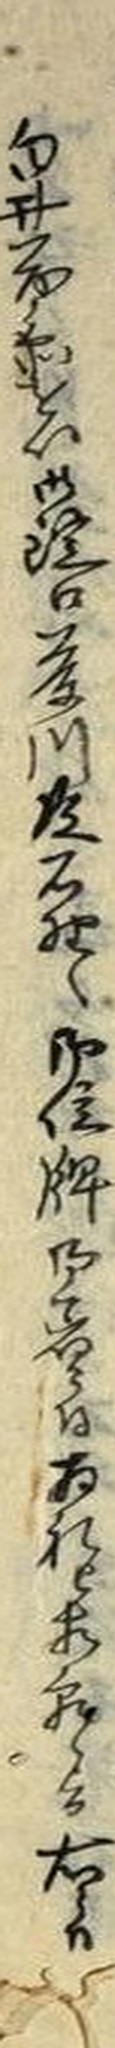白井茂兵衛を以御錠口藤川殿石野へ御位牌御着ニ付拝礼被相願候旨右ニ付
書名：少傅日録抄（斉善付側向頭取日記、江戸并道中、初入在国、逝去後…
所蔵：福井県文書館 Fukui Prefectural Archives
